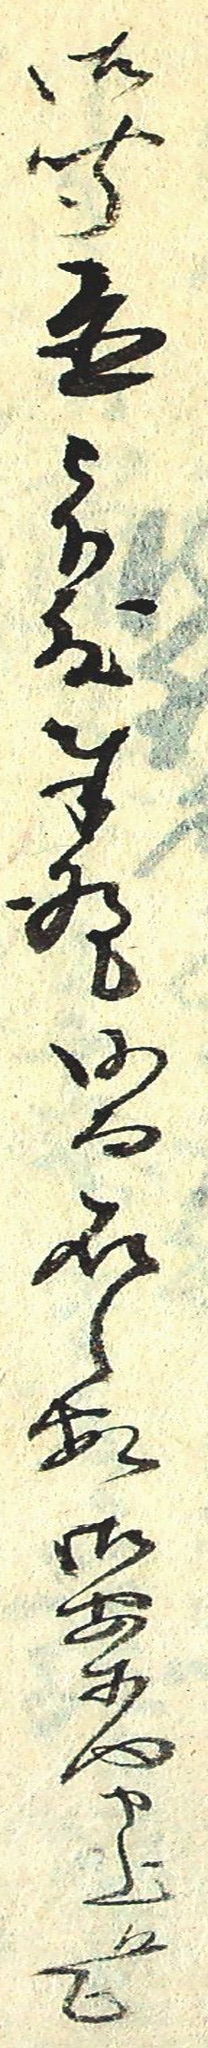御聞置被下度奉存候仍て右之段御案内申上候以上
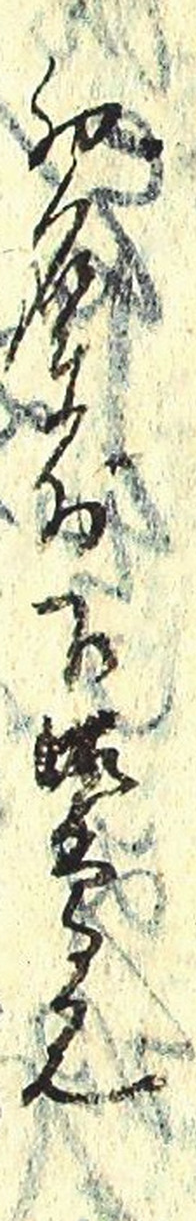西名東村下御鳥見
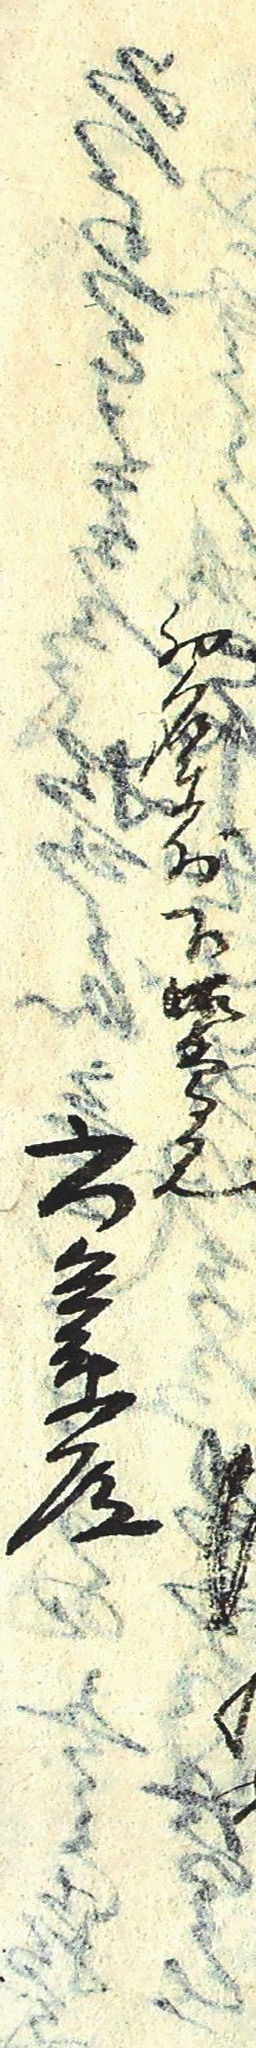六兵衛殿

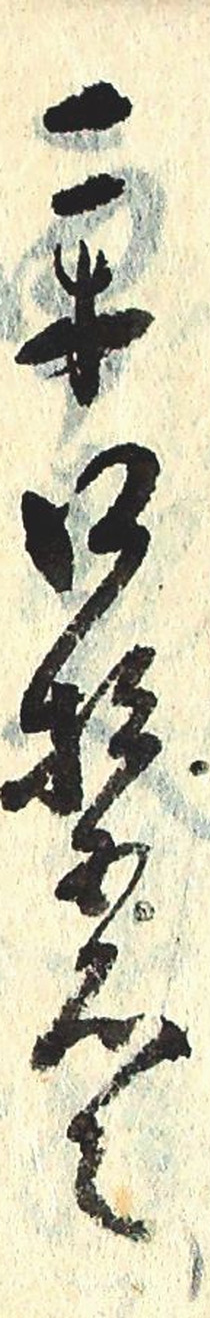一米四拾五石也
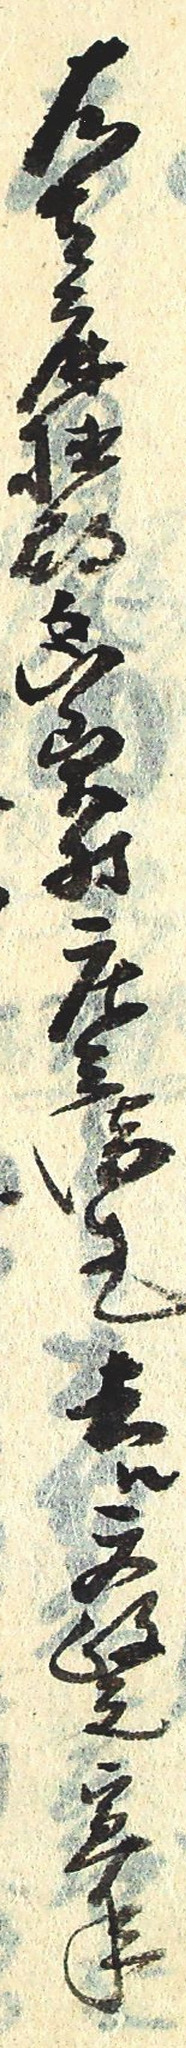右は麻植郡香美村庄兵衛方へ去る文政元寅年
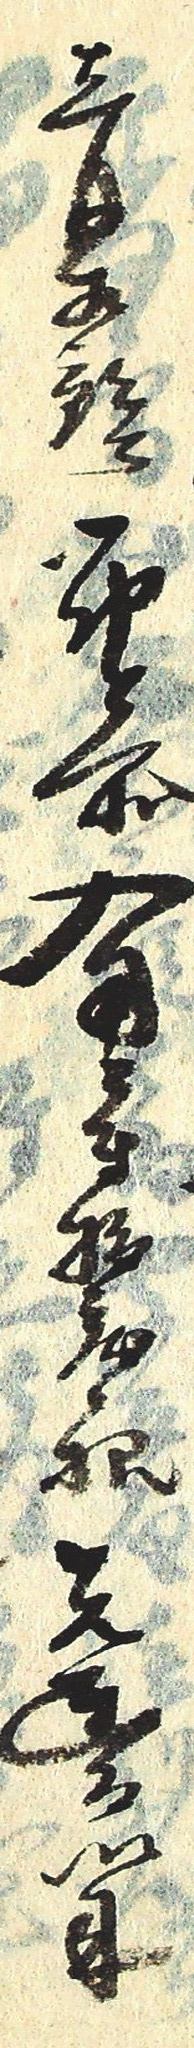十二月相預け御座候所入用に付指戻候様先達て以来
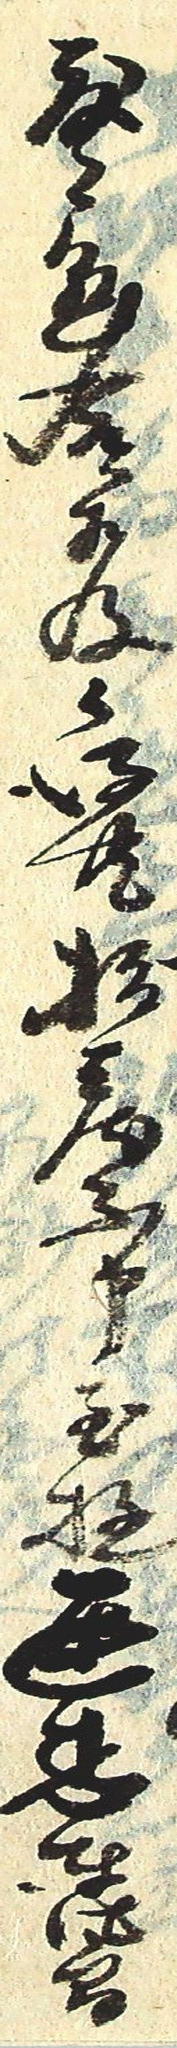度々懸合に相及候得共指戻不申至極迷惑奉仕候間
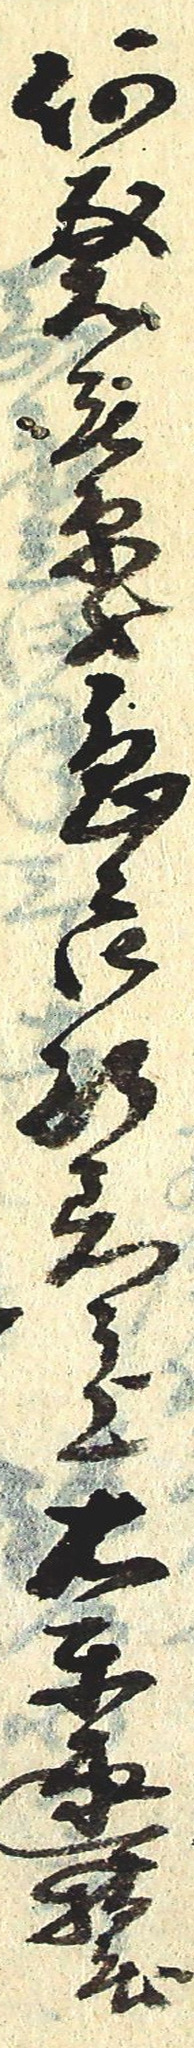何卒右庄兵衛義急々御行着之上右米速指戻
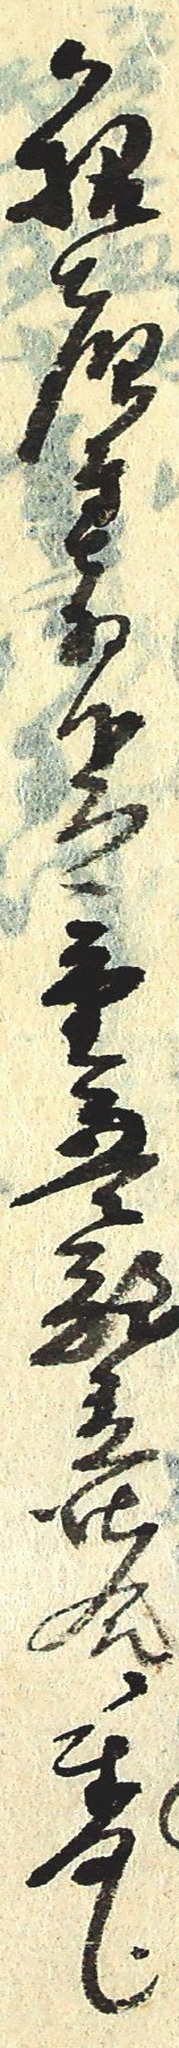候様被仰付被為下候はゝ重畳難有仕合に奉存候
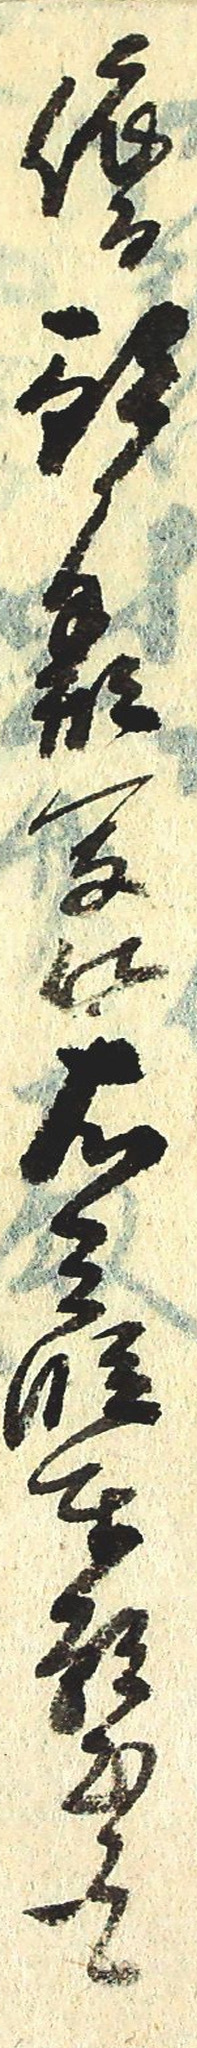依て預り手形写仕右之段奉願上候以上
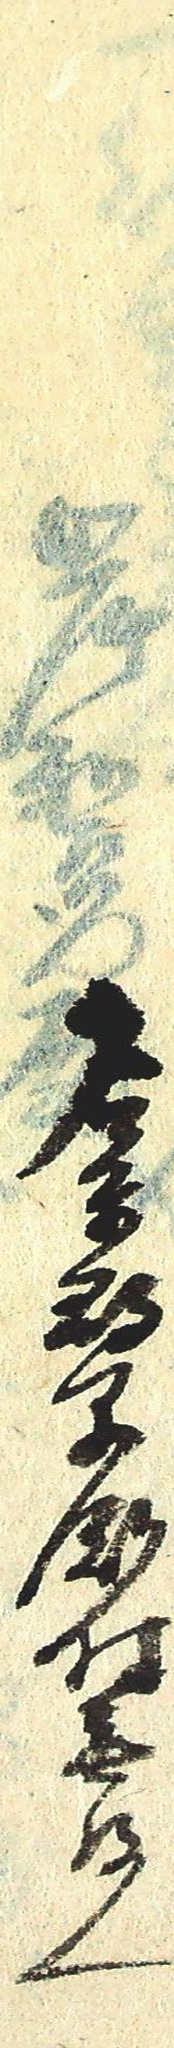名東郡早淵村無役人
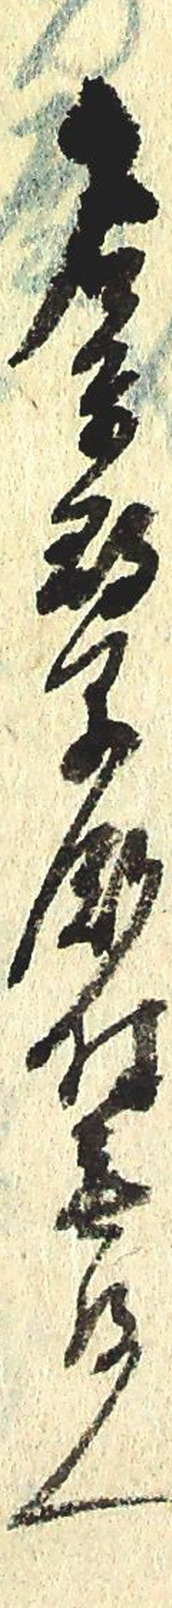名東郡早淵村無役人
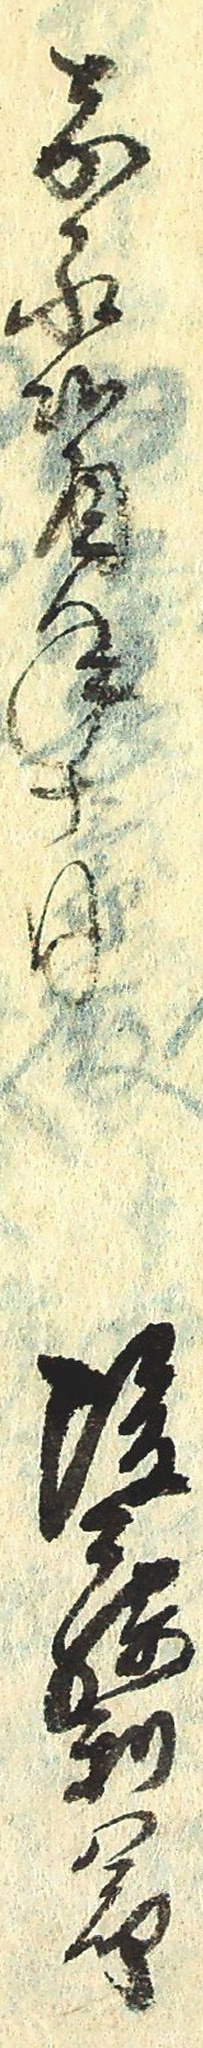嘉永弐酉年十月後藤利八郎
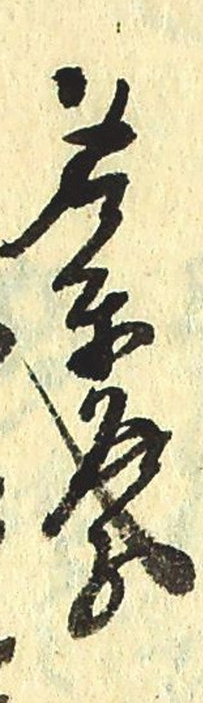名東名西
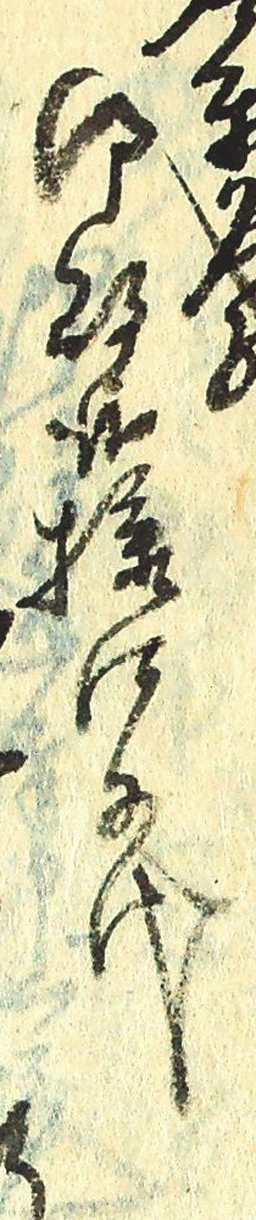御郡代様御手代
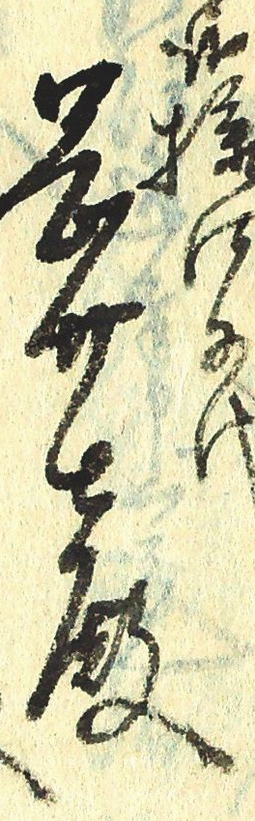岡竹七殿
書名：諸御願書控(弐番）
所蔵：鳴門教育大学 Naruto University of Education
